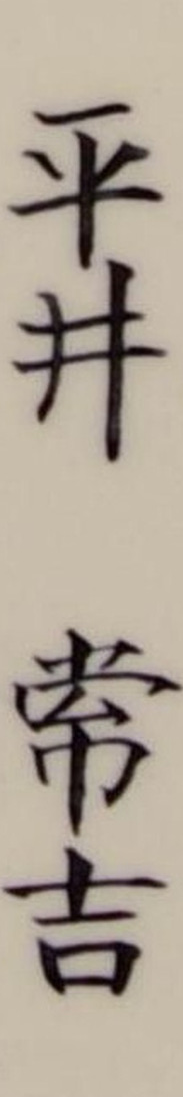平井常吉
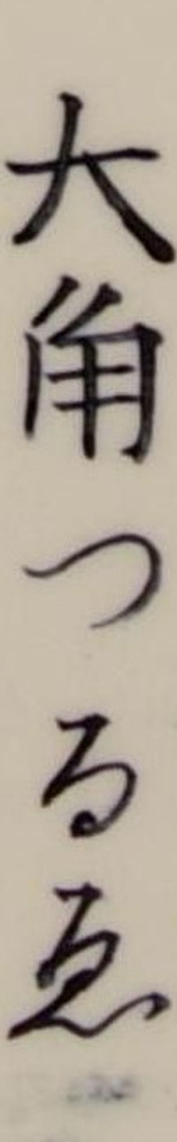大角つるゑ
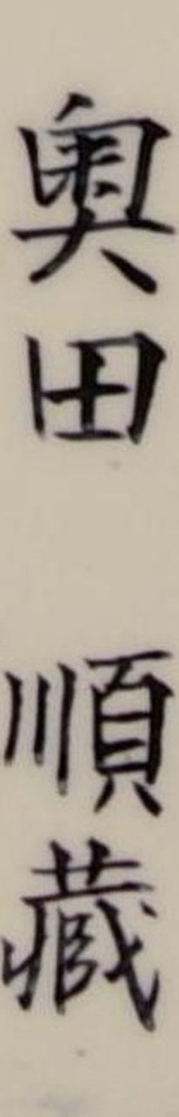奥田順藏
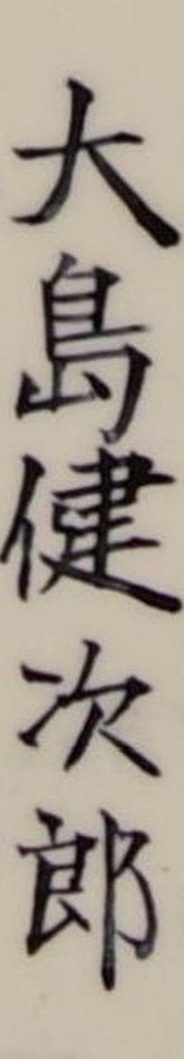大島健次郎
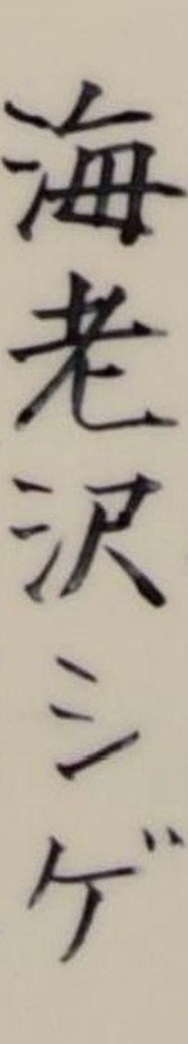海老沢シゲ
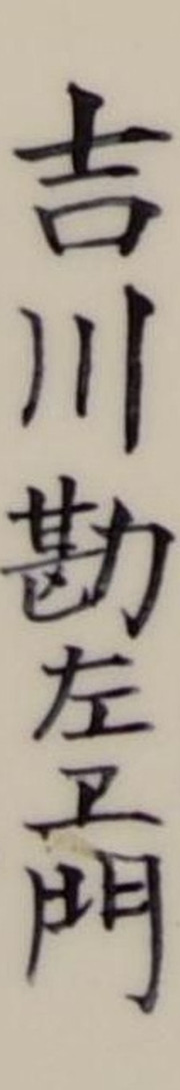吉川勘左ヱ門
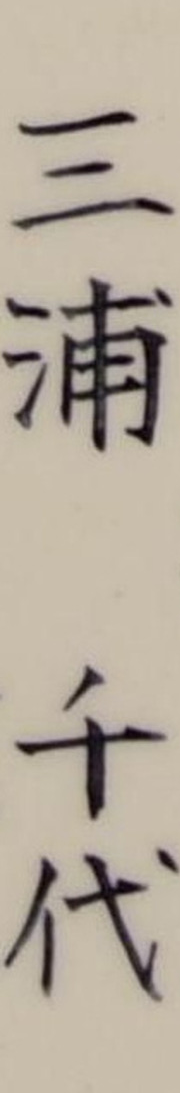三浦千代
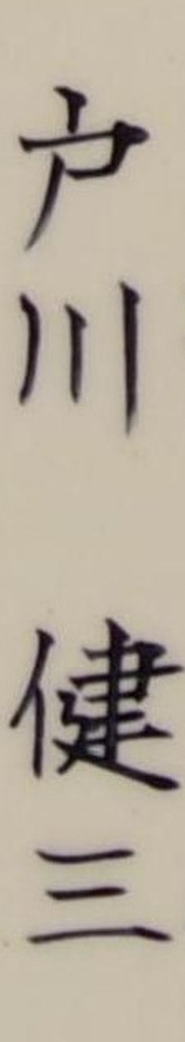戸川健三
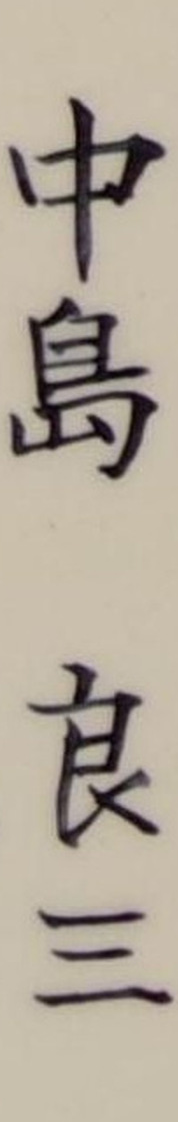中島良三
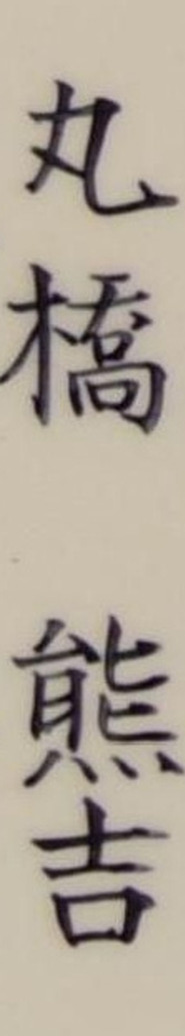丸橋熊吉
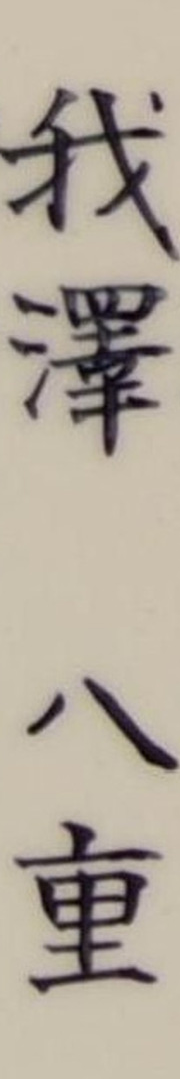我澤八重
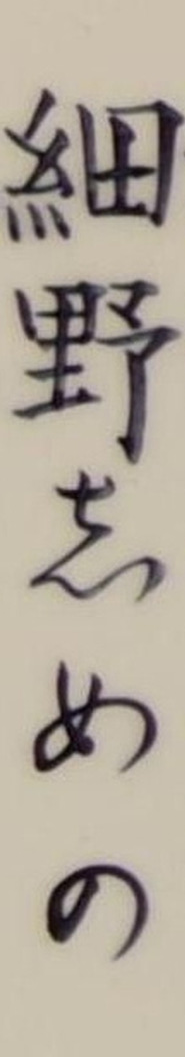細野しめの
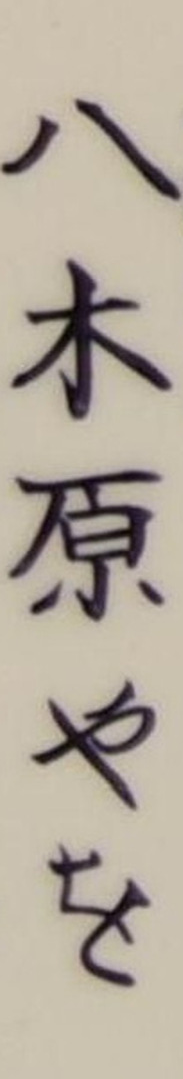八木原やを
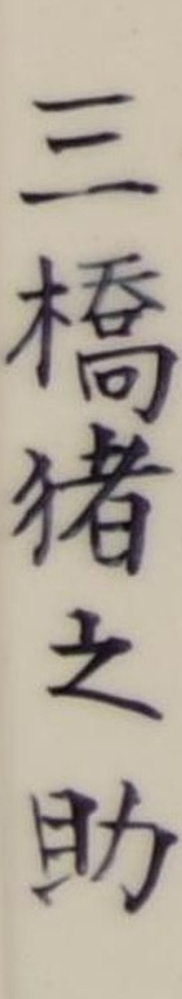三橋猪之助

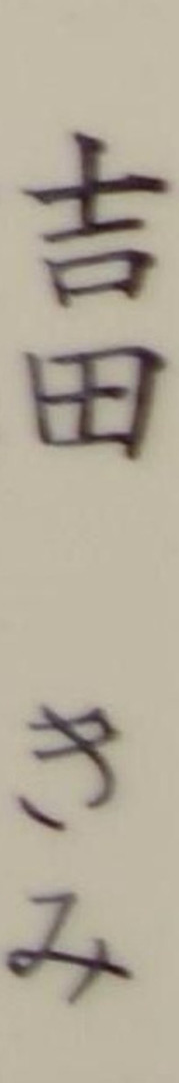吉田きみ
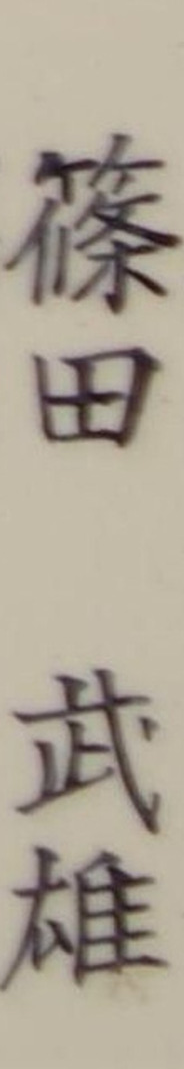篠田武雄
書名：M~S
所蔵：高野山金剛峯寺
